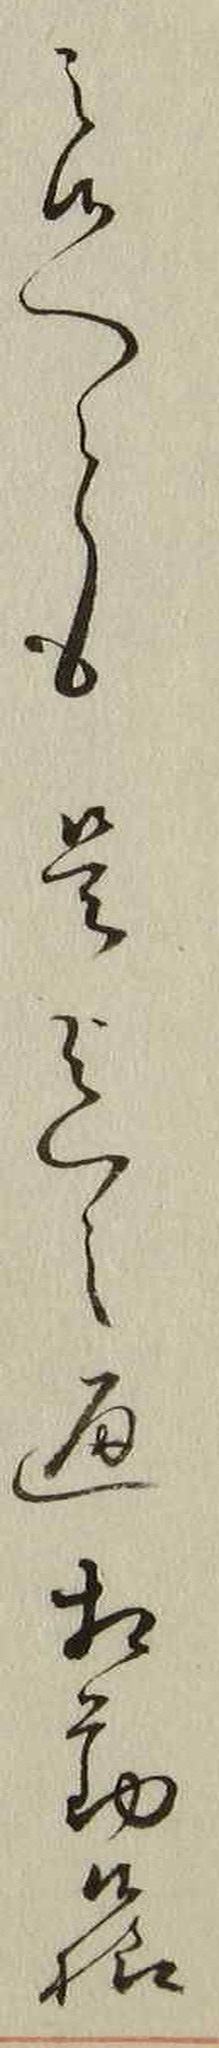之候へとも是迄之通相勤候様
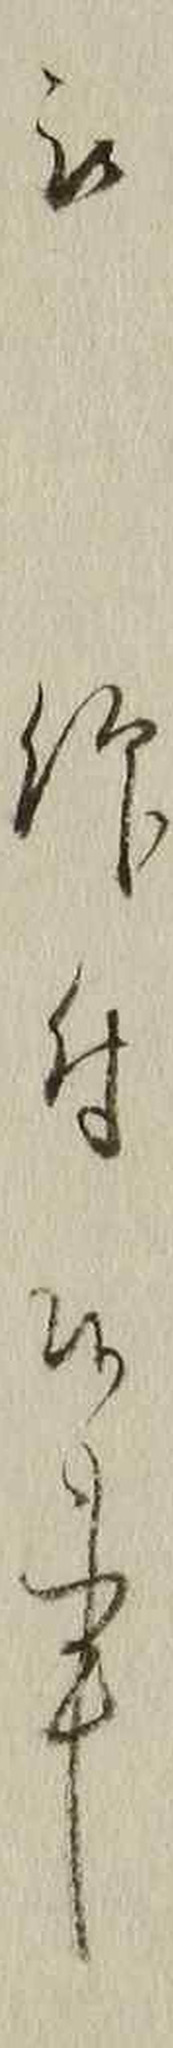被仰付候事
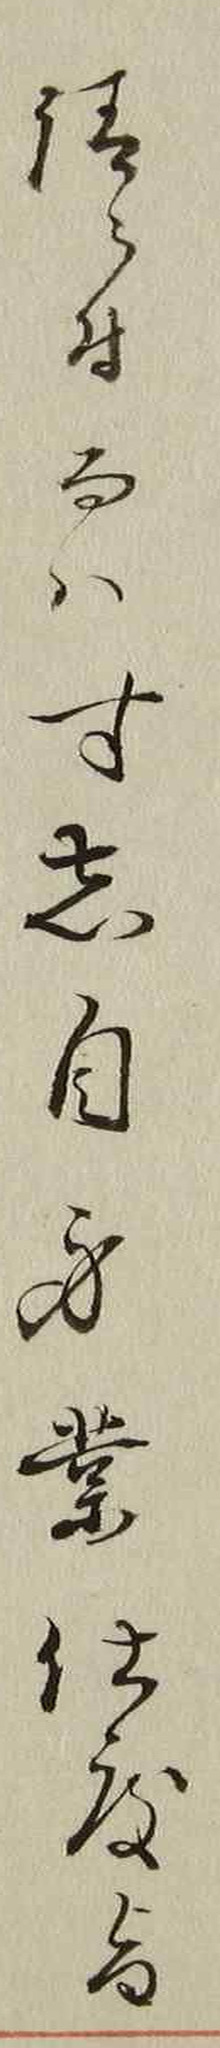請ニ付而ハ寸志自身業仕度旨
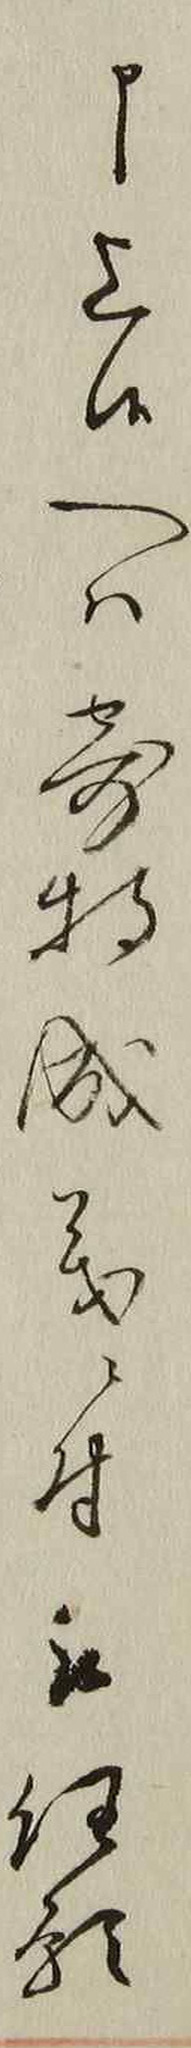申上候へハ奇特成義ニ付被任願
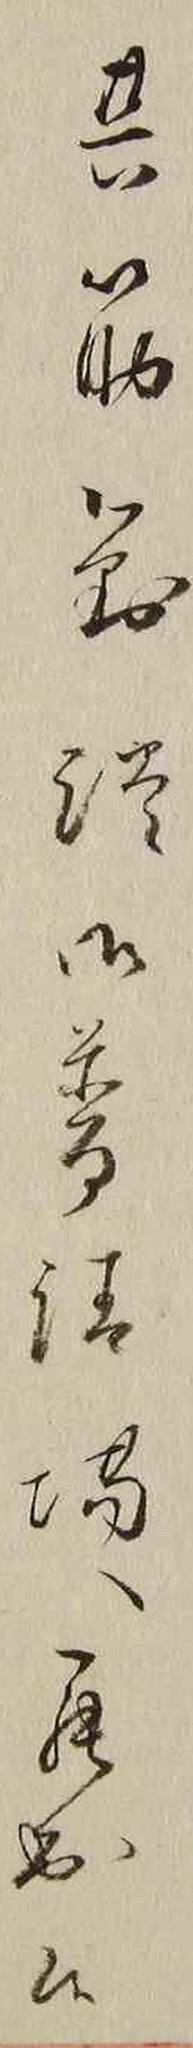其筋対談御普請場へ罷出候
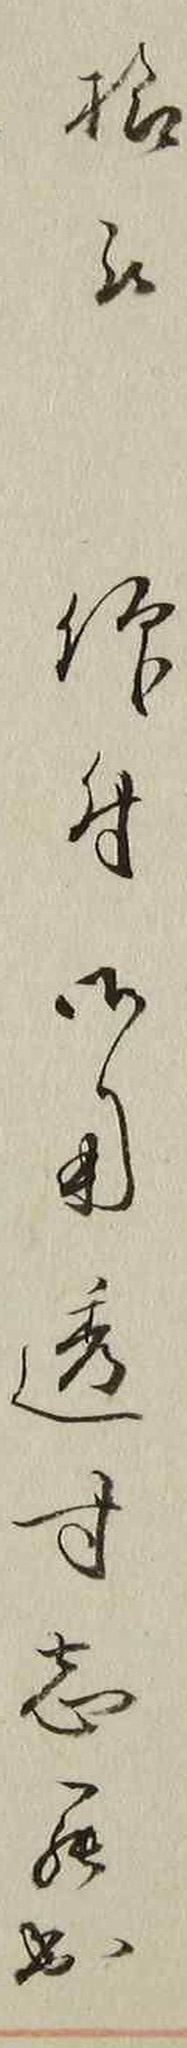様被仰付御用透寸志罷出
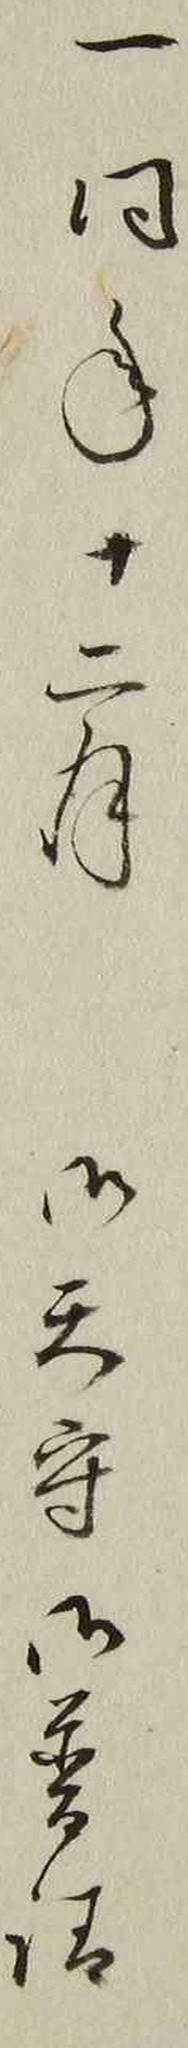一同年十二月御天守御普請
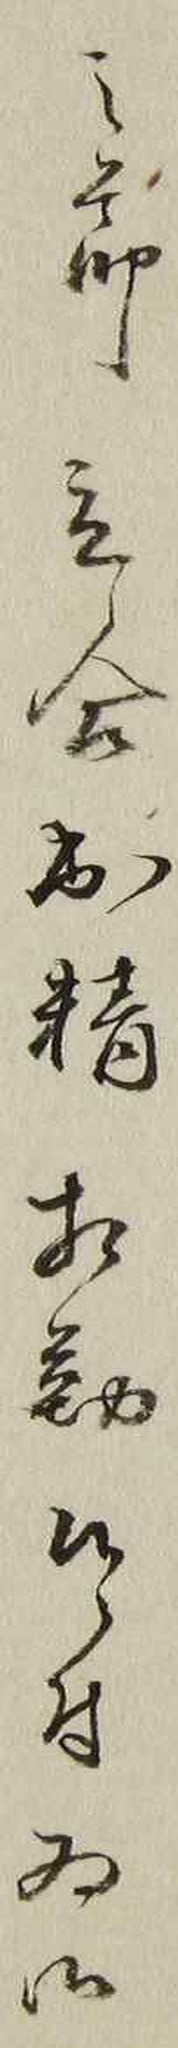之節立合出精相勤候ニ付為御
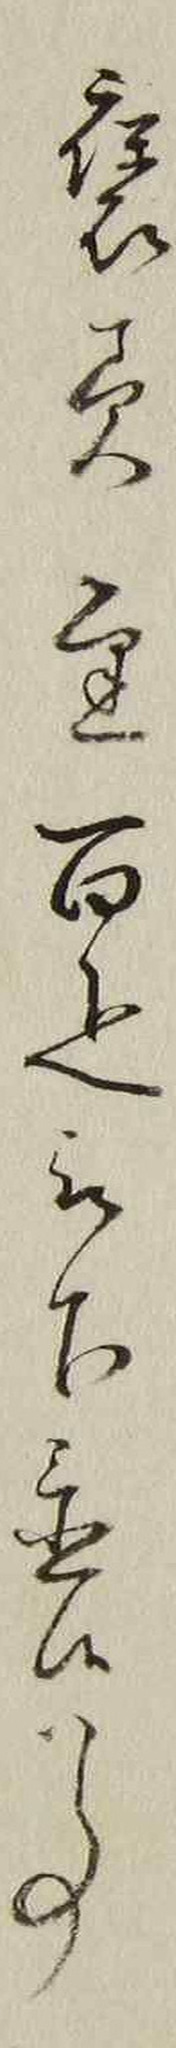褒美金百疋被下置候
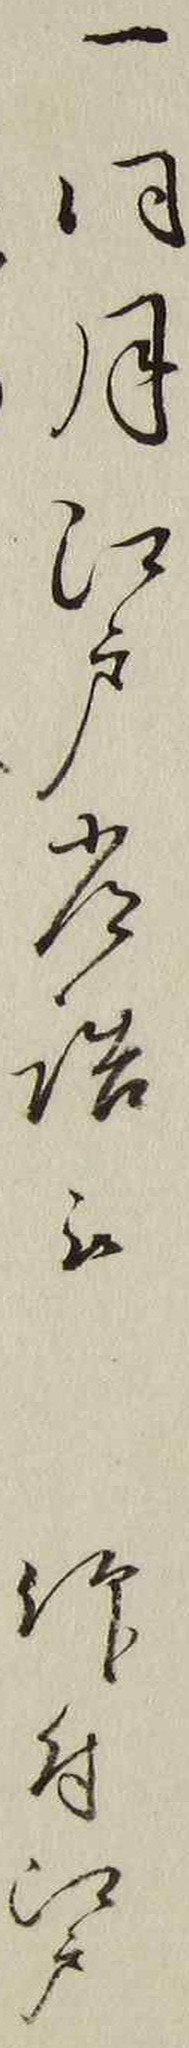一同月江戸常詰被仰付江戸
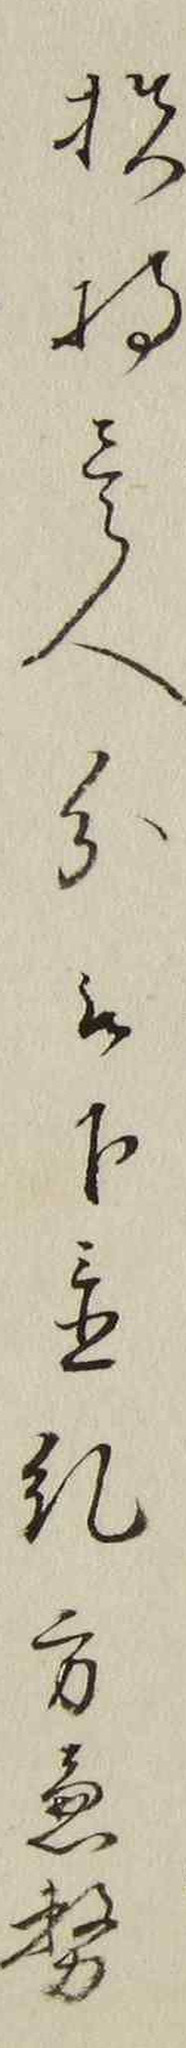扶持壱人分被下置糺方兼務
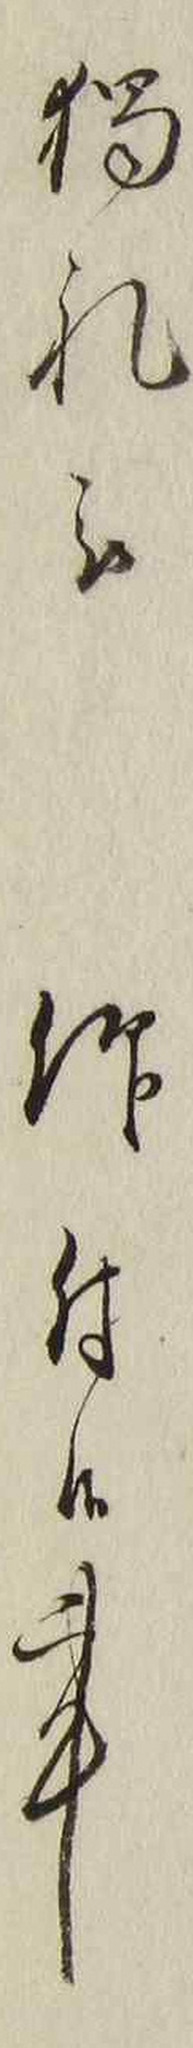独礼被仰付候事

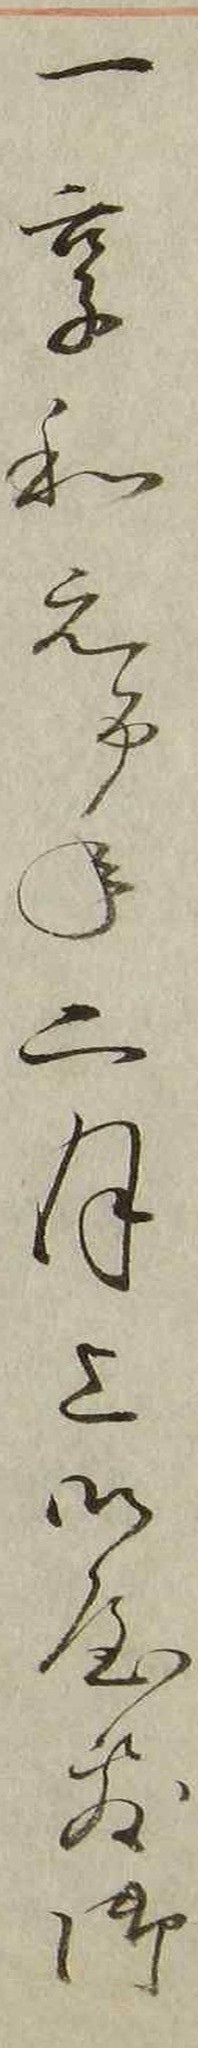一享保元酉年二月上御屋敷御
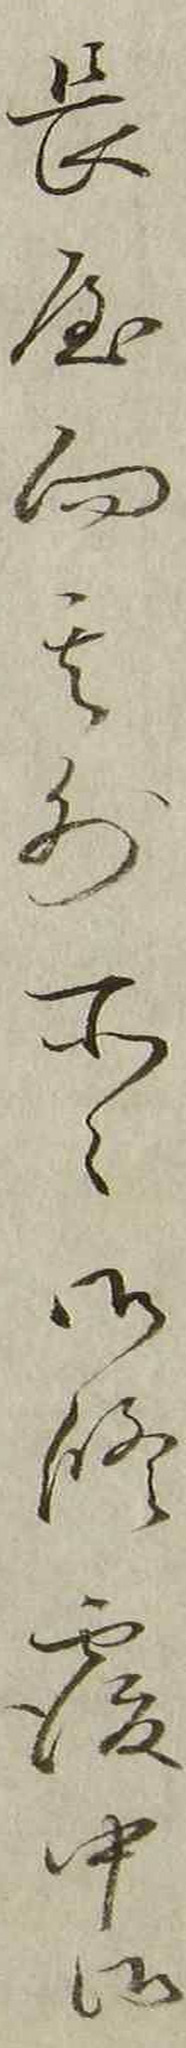長屋向其外所々御修覆中御
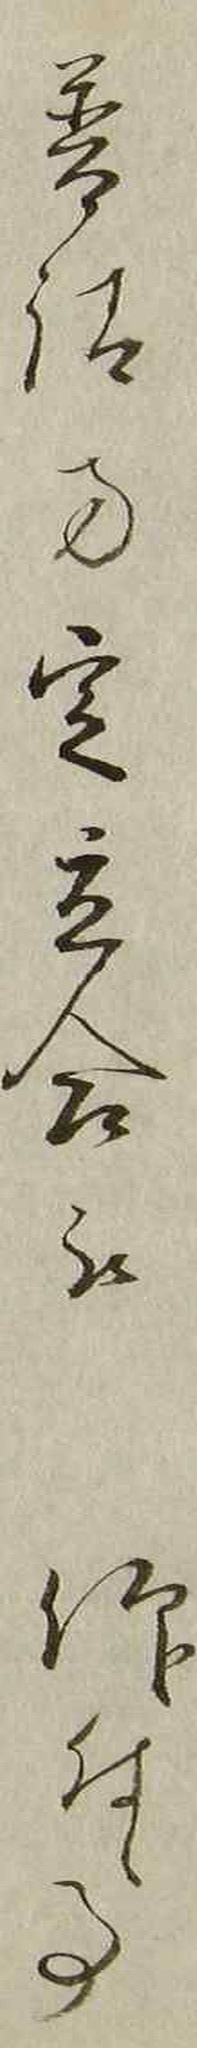普請方定立合被仰付候事
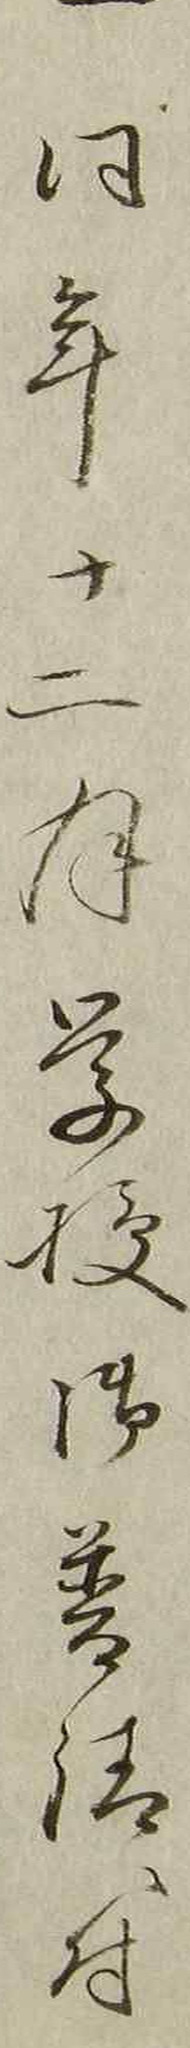一同年十二月学校御普請ニ付
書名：諸士系譜　巻之8　い之部8
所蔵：会津若松市立会津図書館
